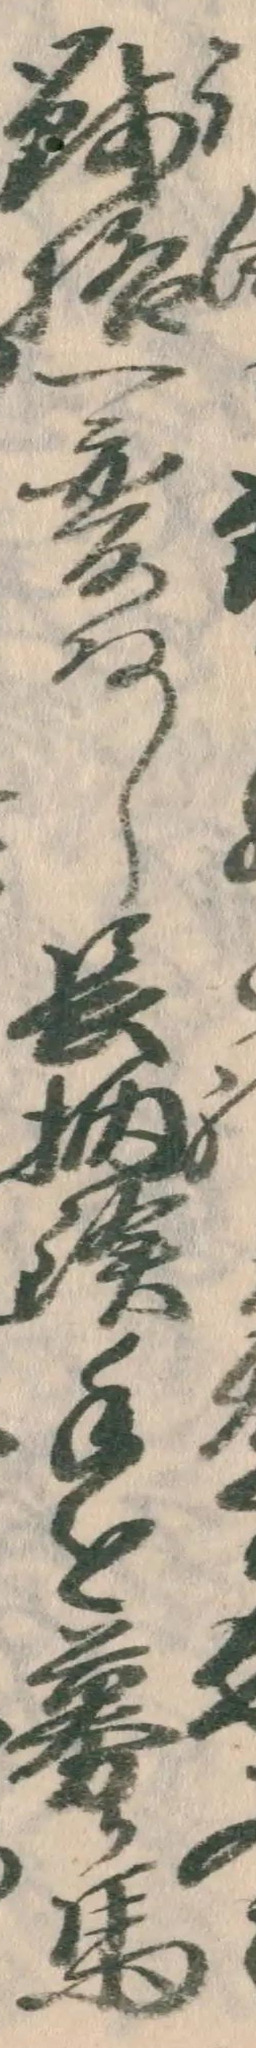戦格一変なし長柄鎗手を募り馬
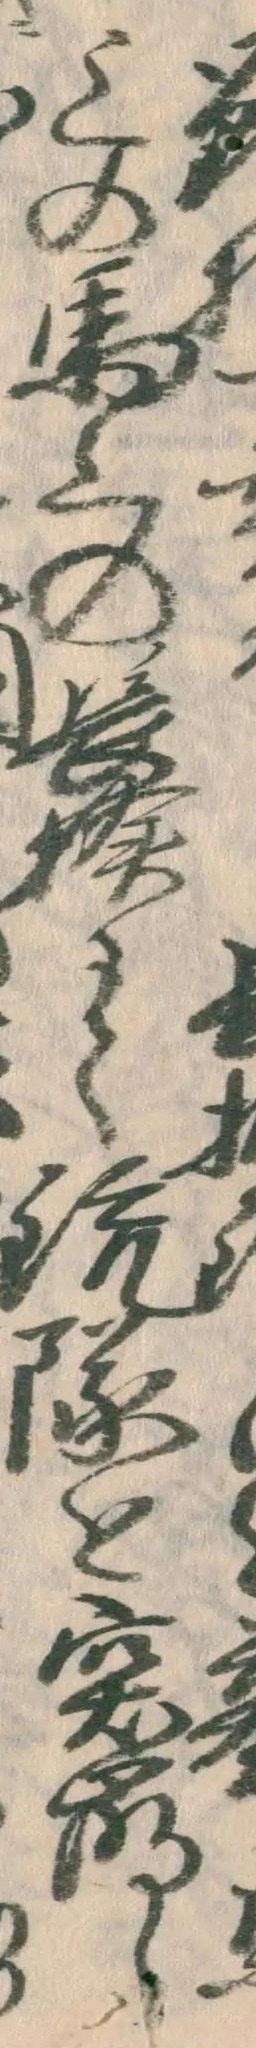上の馬上の長槍にて銃隊を突崩し
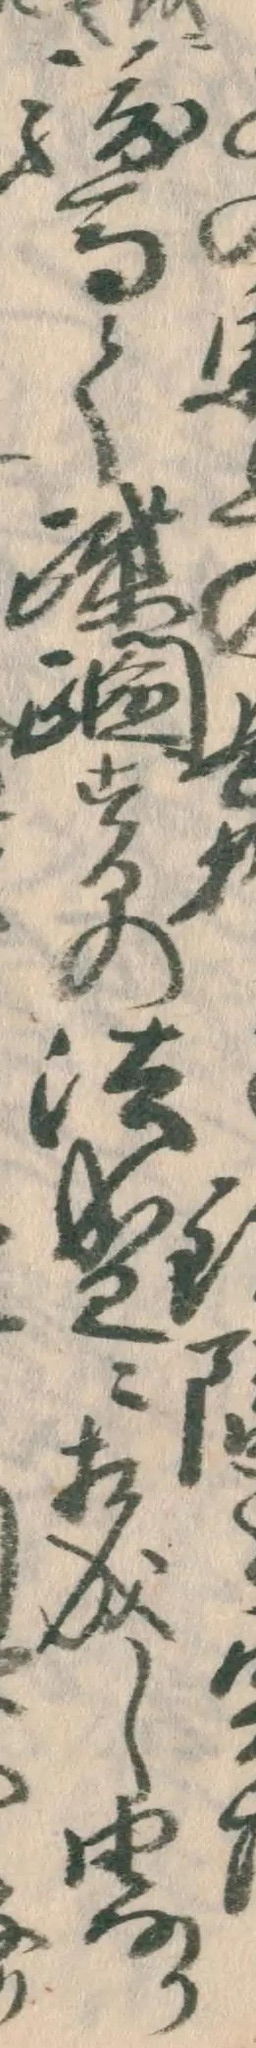騎馬て蹂躙するの法盛ニ相成し由なり
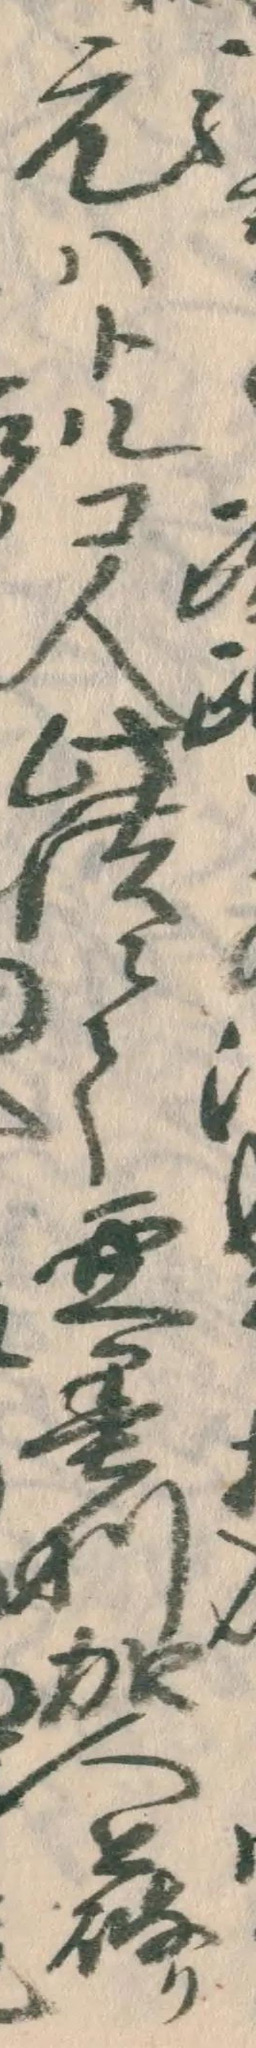元ハトルコ人此法ニて亜墨利加人を破り
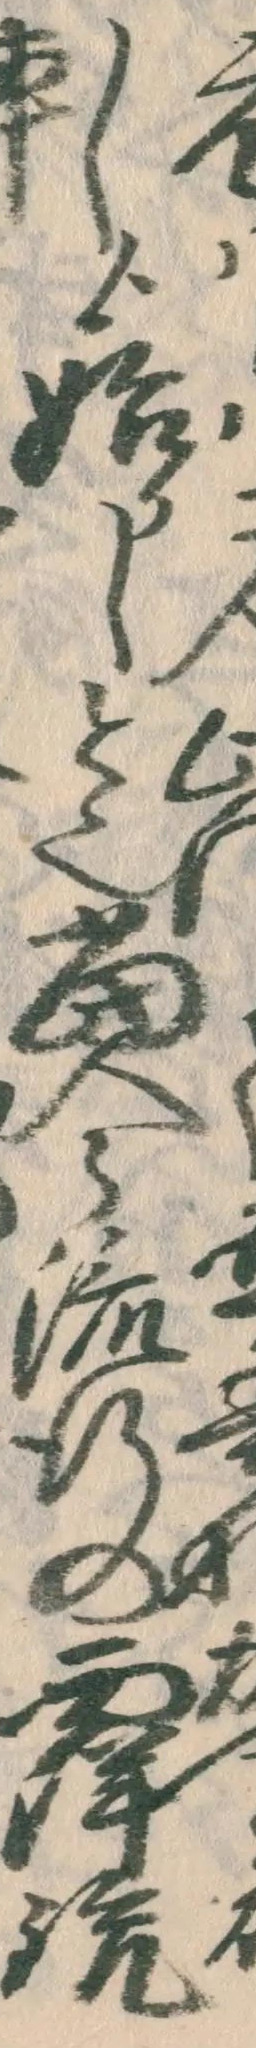しゟ始申と也當今流行の西洋銃
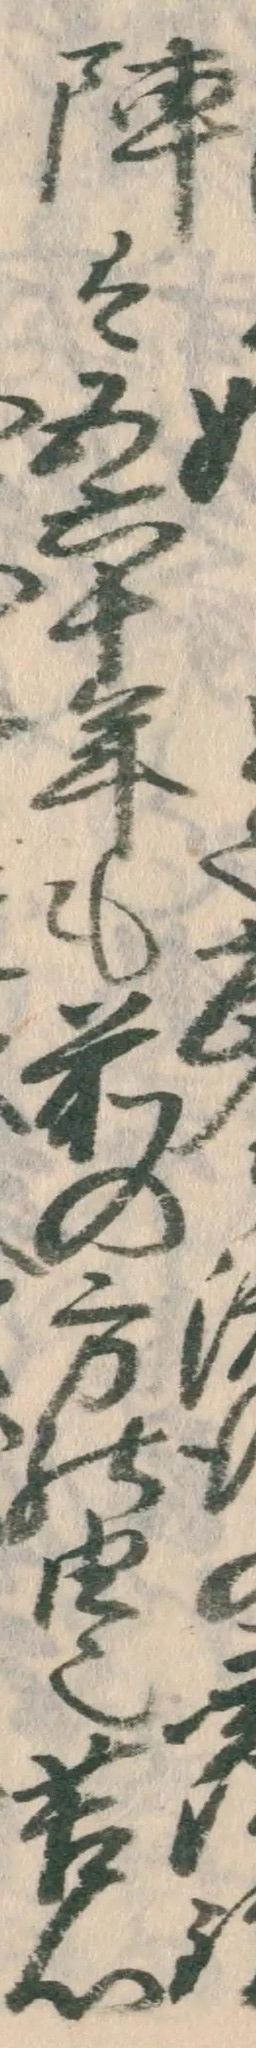陣は五六十年も前の方の由也苦心
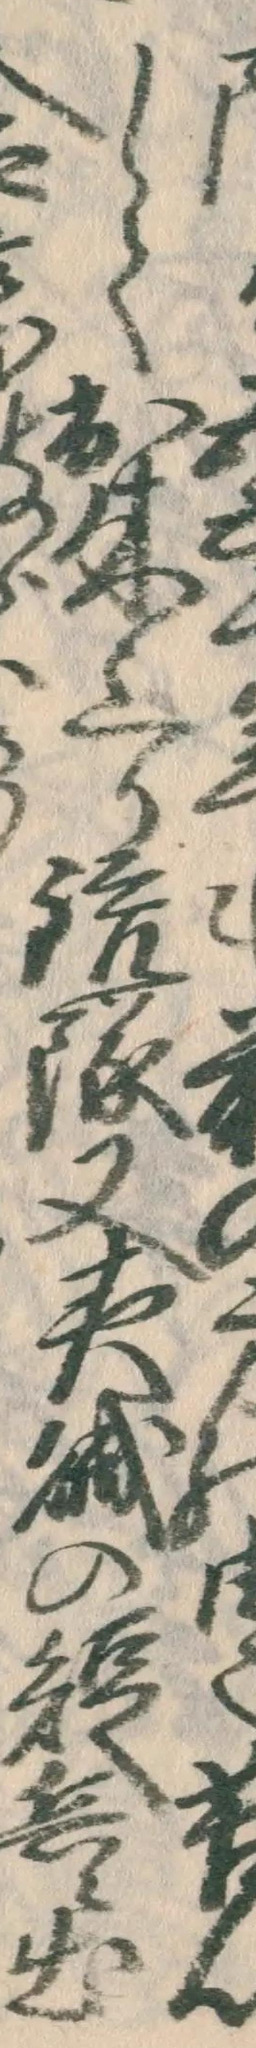して出来上り銃隊又夷絨の短兵ニ出
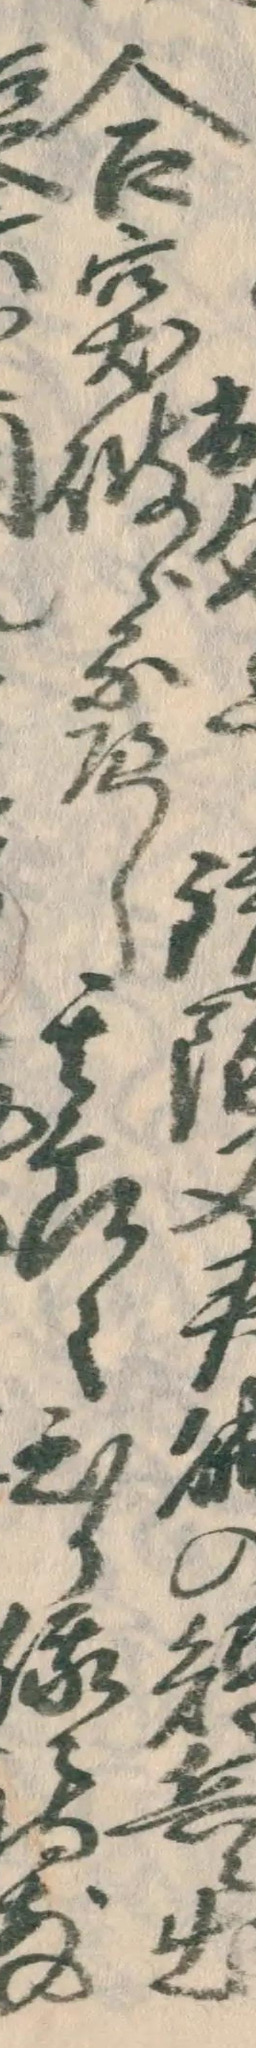合突破らるへし其節に至り俄ニ持前の
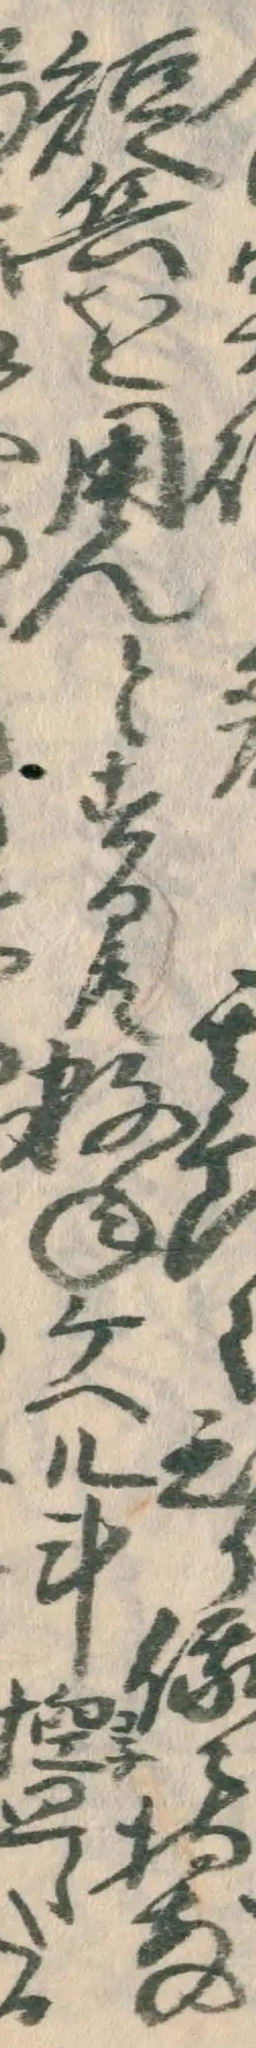短兵を用んとする共数年ケヘル斗揑廻したる
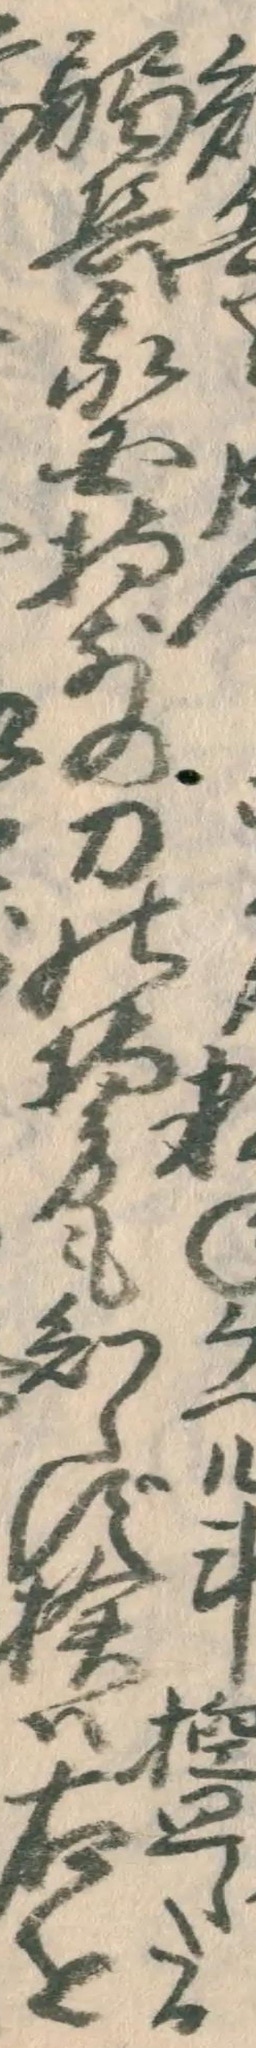弱兵我国持前の刀の抜身も知らず槍ハ右を
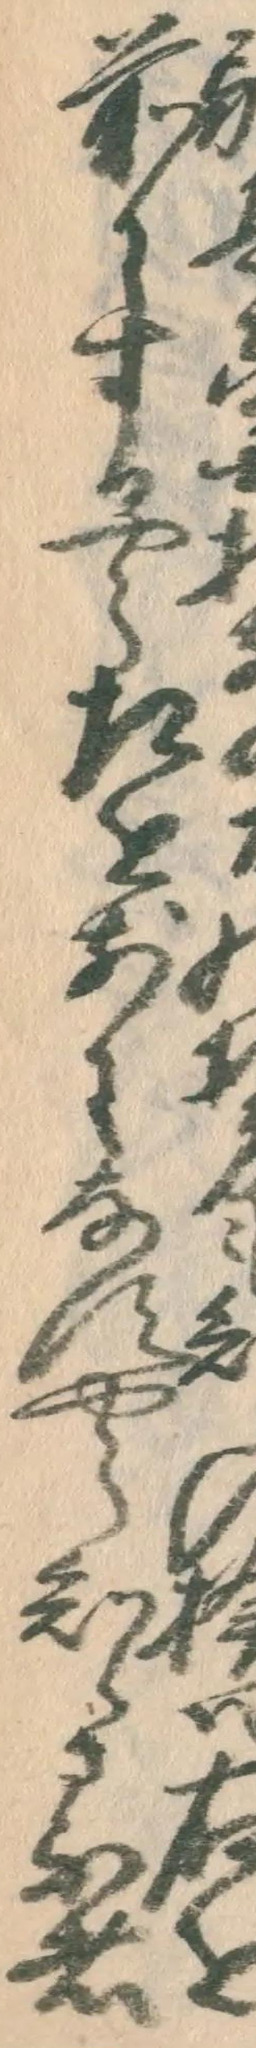前にするやら左を前になすやら知らさる者

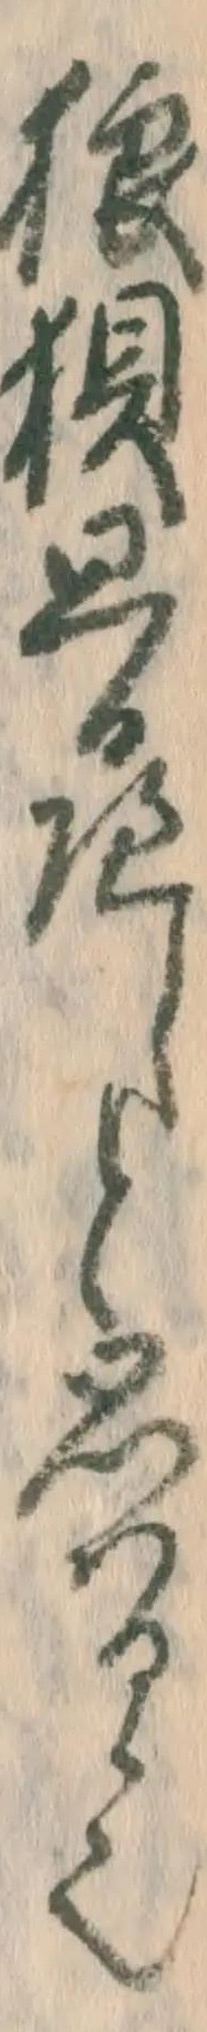狼狽廻るへしと思はるゝ也
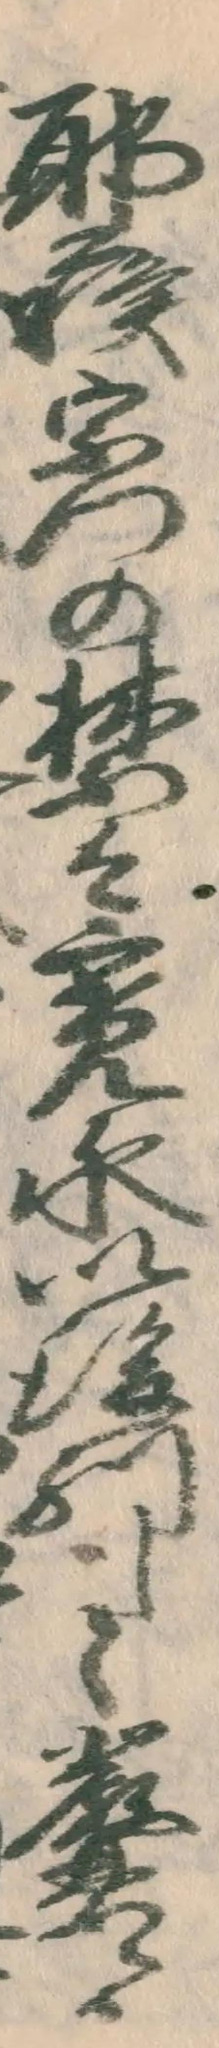一耶蘇宗門の禁は寛永以後別して厳禁候而
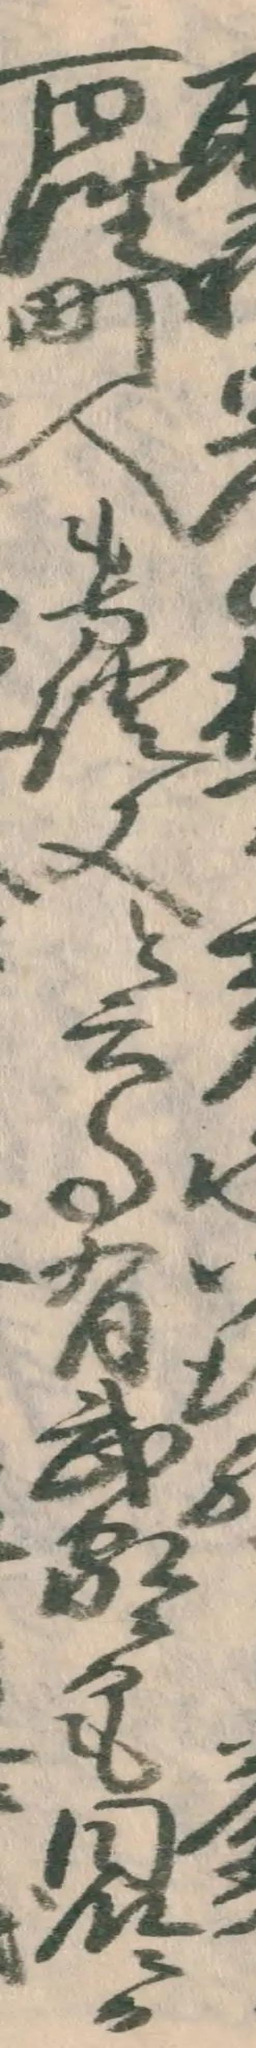百姓町人も寺證文と云事有武家ニ而も同様ニ而
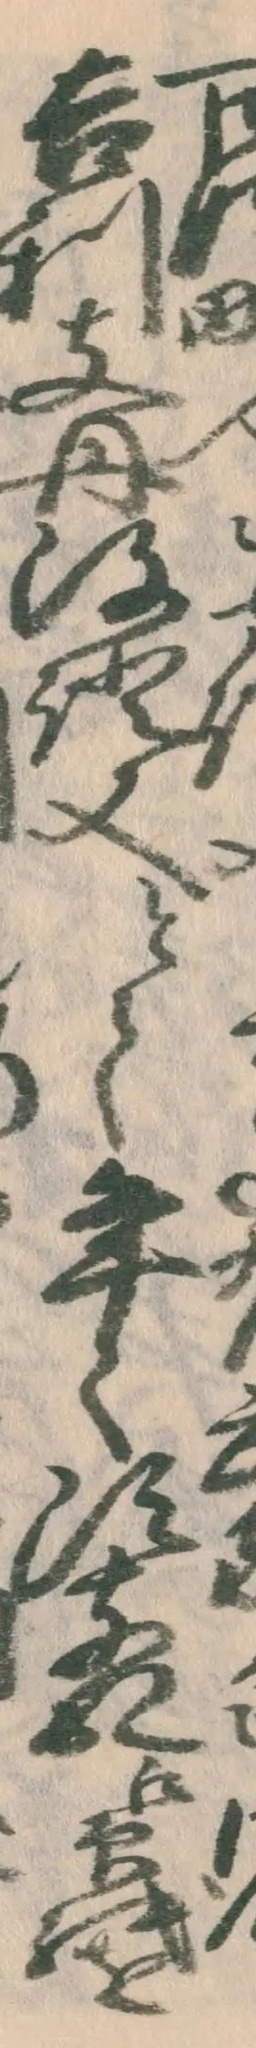吉利支丹證文とて年々組支配江印紙を
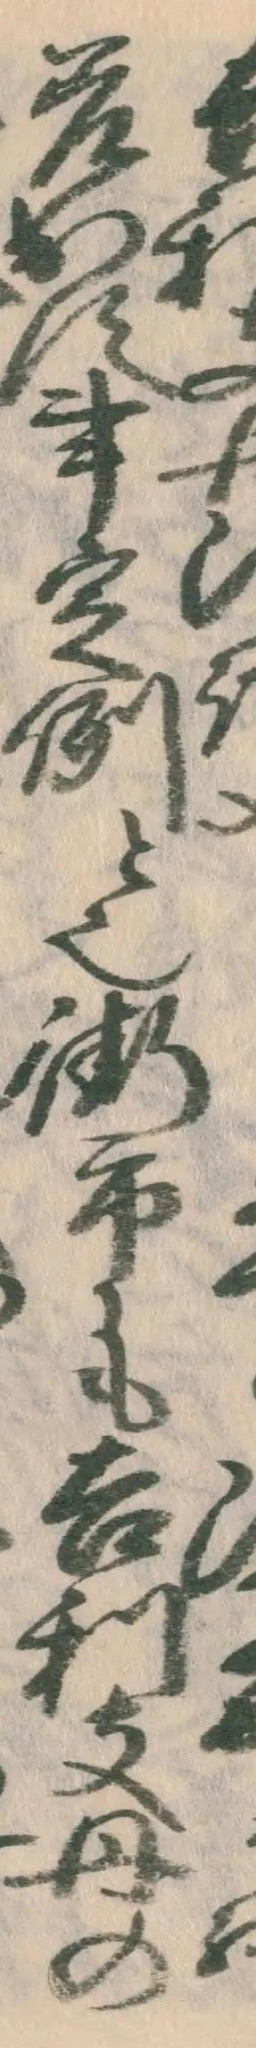差出す事定例と也街市にも吉利支丹の
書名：麗斎叢書. 20
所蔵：国立国会図書館 National Diet Library, JAPAN
